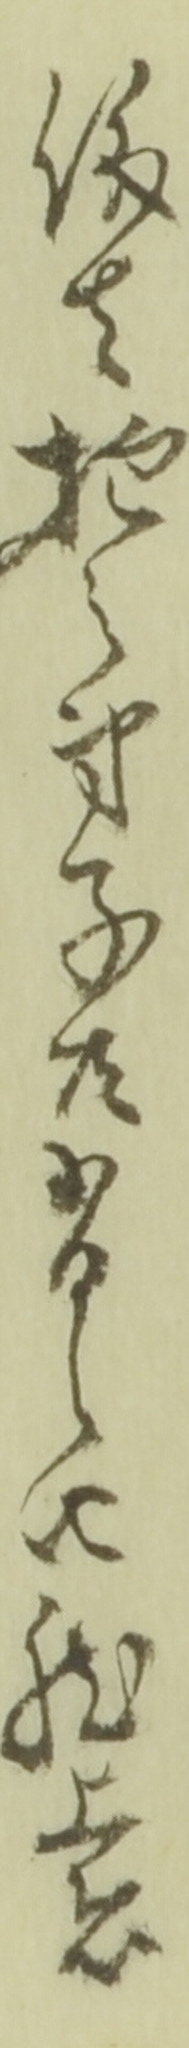依其抱候弟子共有之候然上者
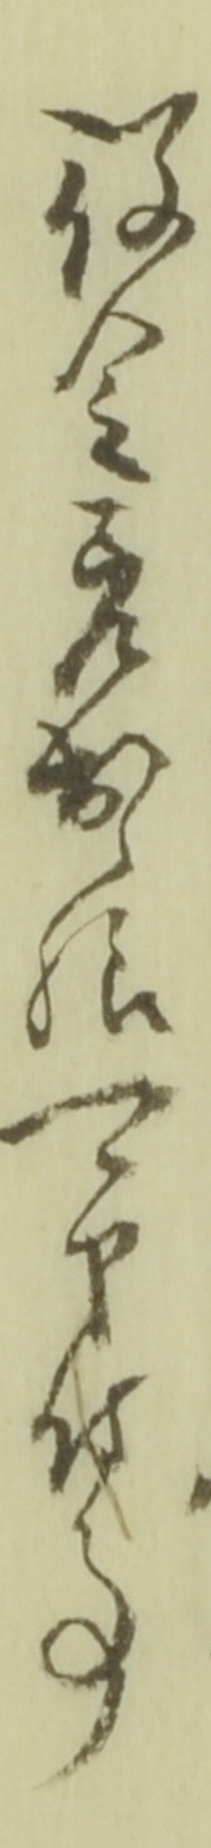役金差出候様可申付事
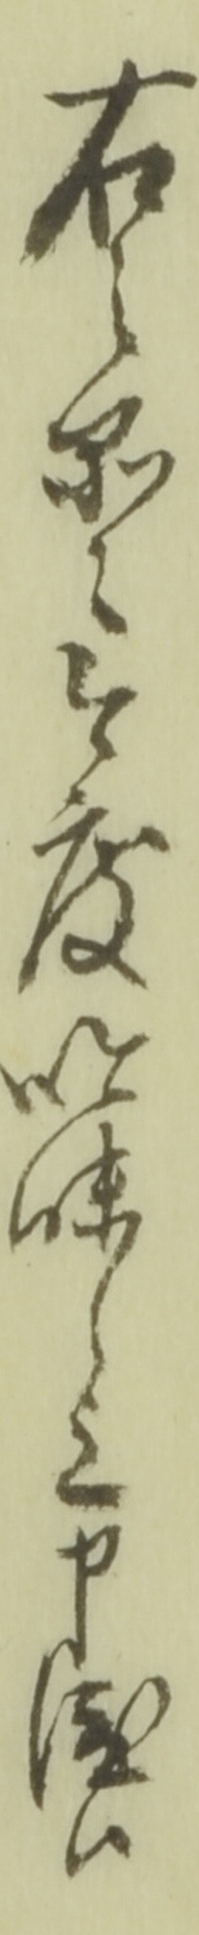右之品々今度吟味候上申渡候
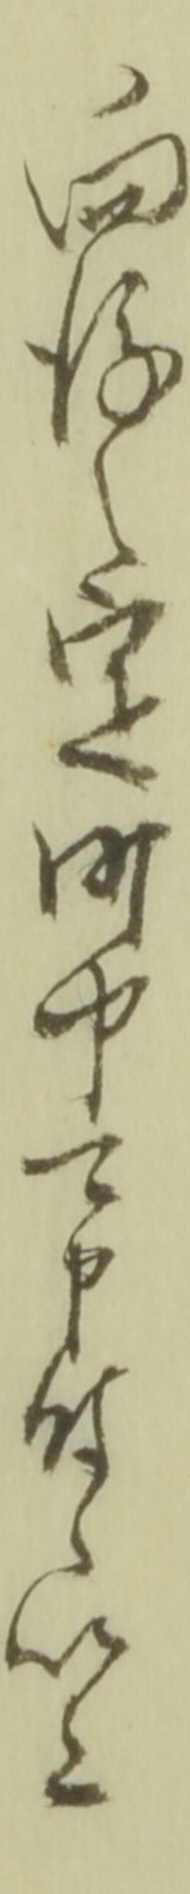向後の定町中可申付候以上
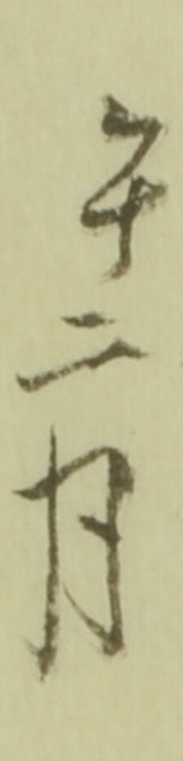午十二月
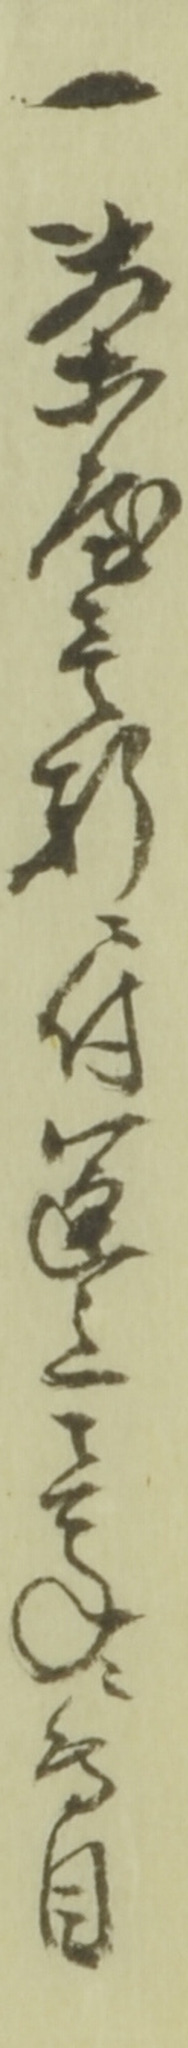一漆屋壱軒二付運上壱年二鳥目
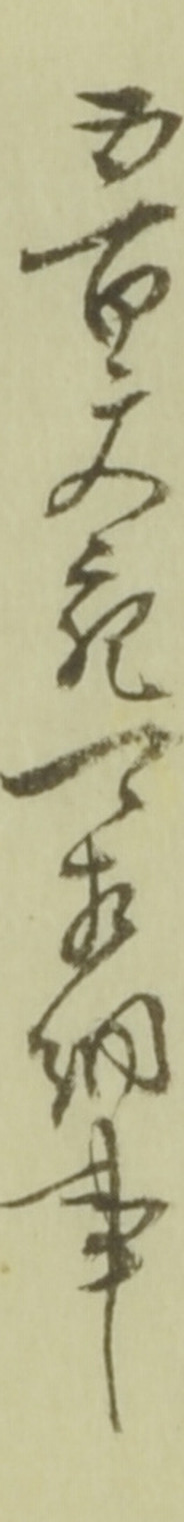五百文宛可相納事
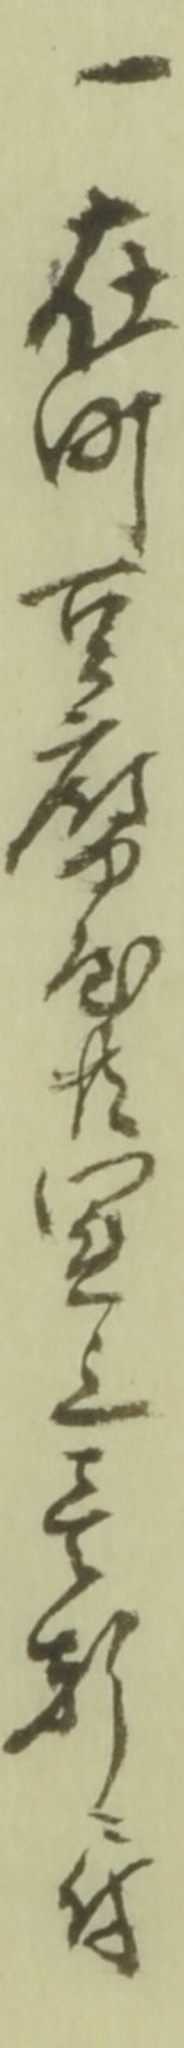一在町豆腐屋共運上壱軒二付
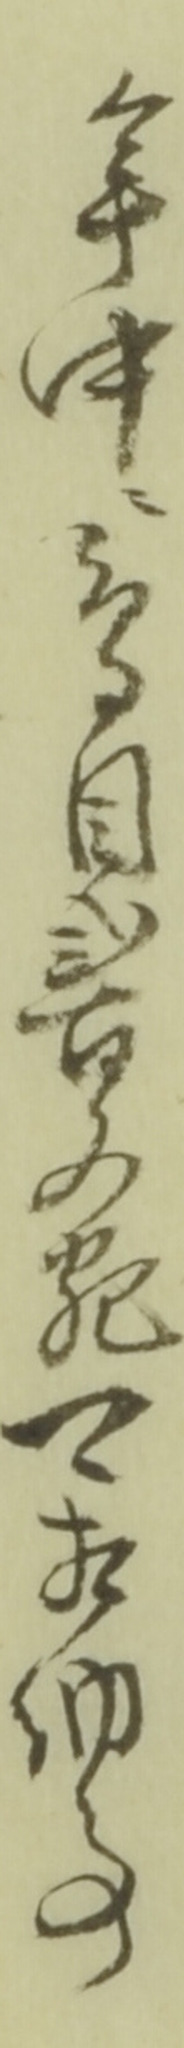年中二鳥目弐百文宛相納事
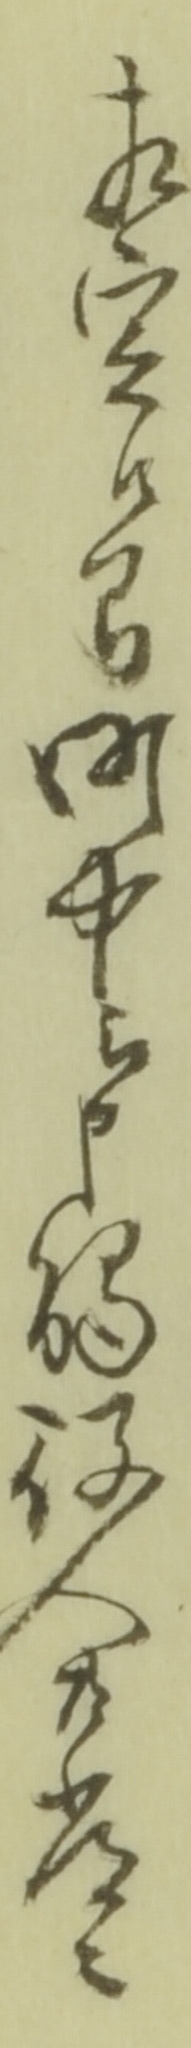相定候間町中え申触役人共厳二
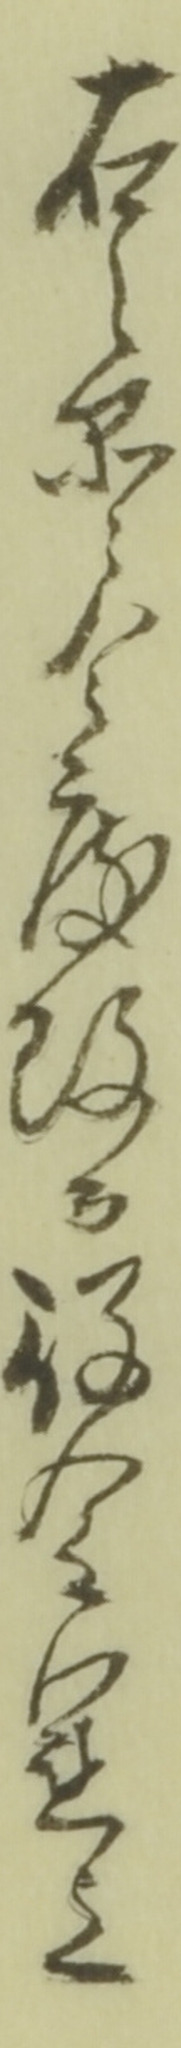右之品々今度改而役金運上
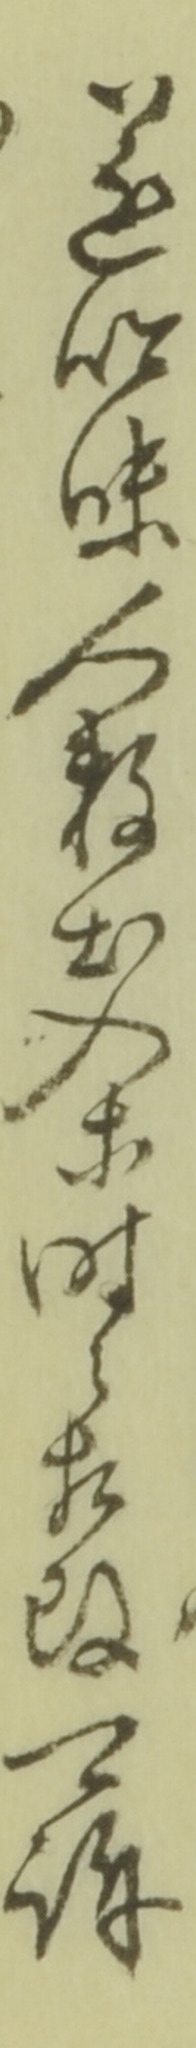遂吟味人数出入等時々相改可
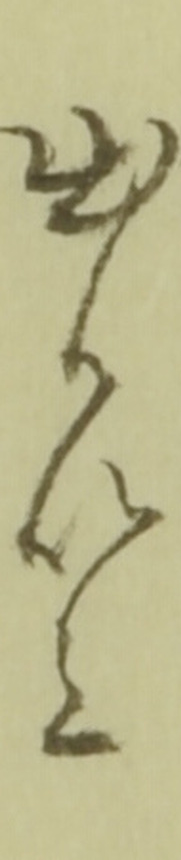出候以上
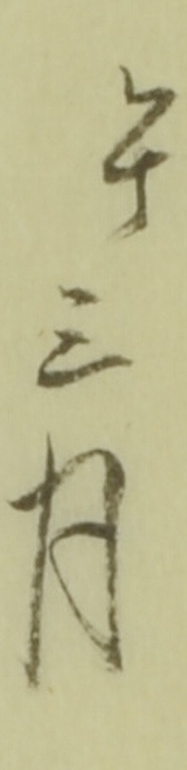午三月
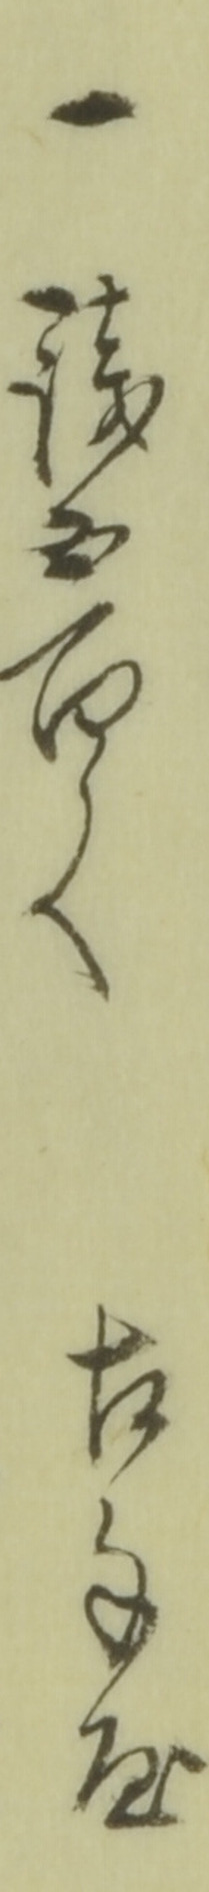一銭五百文古手屋
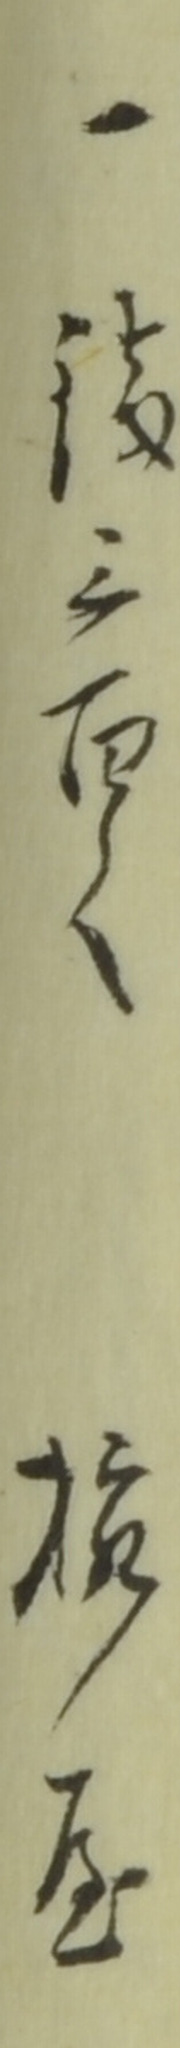一銭三百文麹屋
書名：御公儀様御領主様御触書控
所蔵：伊那市立高遠町図書館・合同会社AMANE
